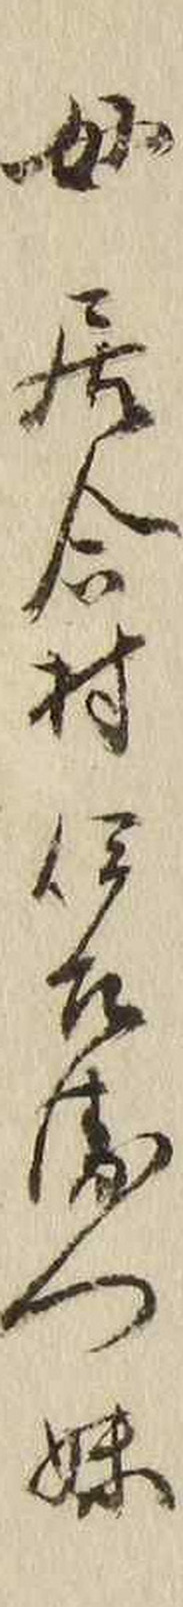母居合村伊左衛門妹

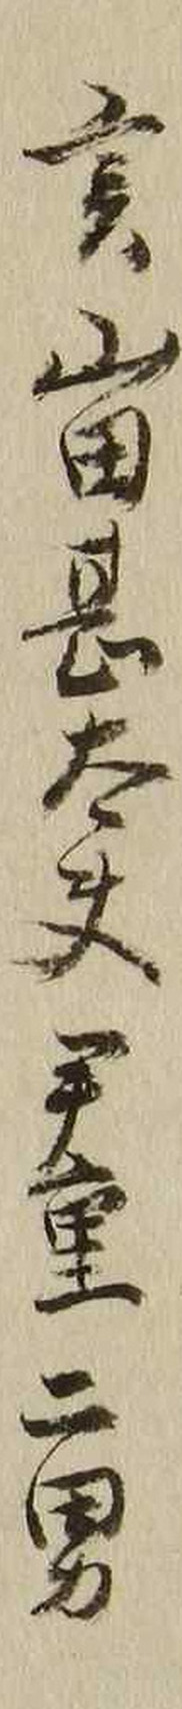実山田甚太夫尹重二男
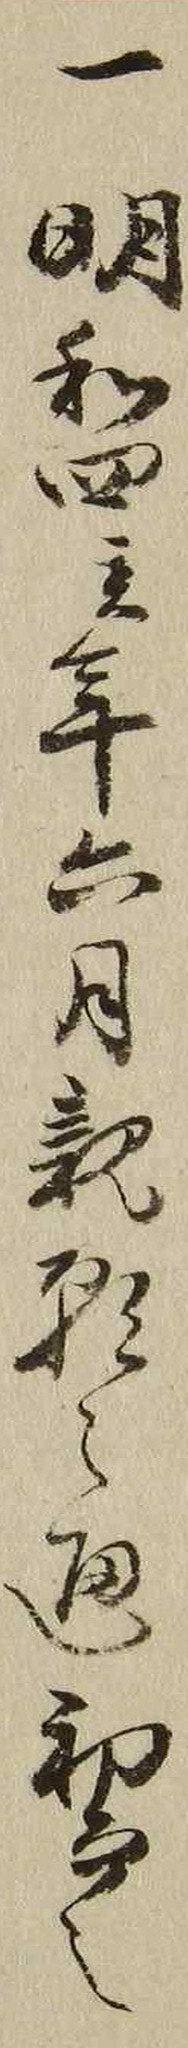一明和四亥年六月親願之通而之
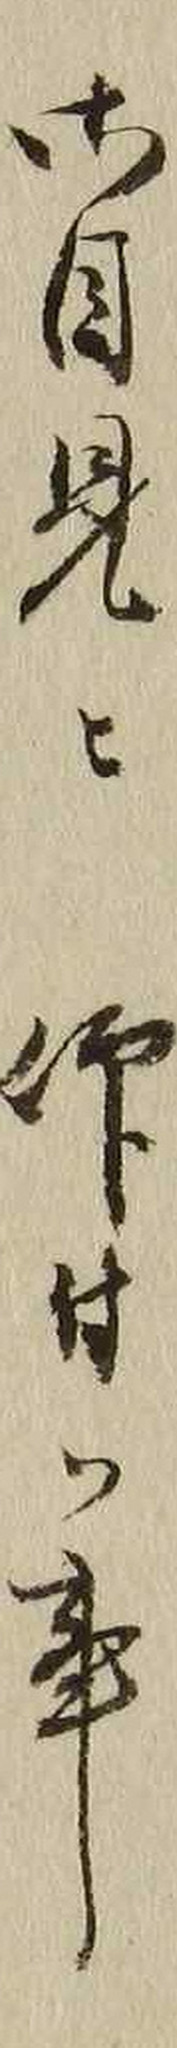御目見被仰付候事
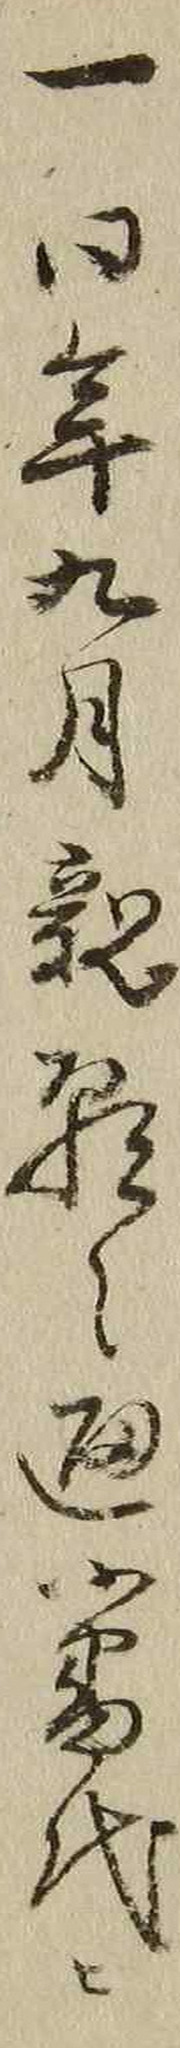一同年九月親願之通御番代被
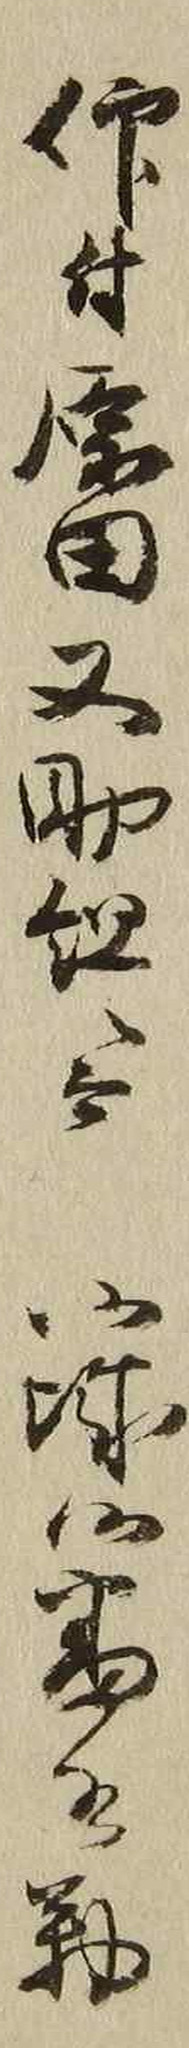仰付原田又助組へ而御城御番相勤
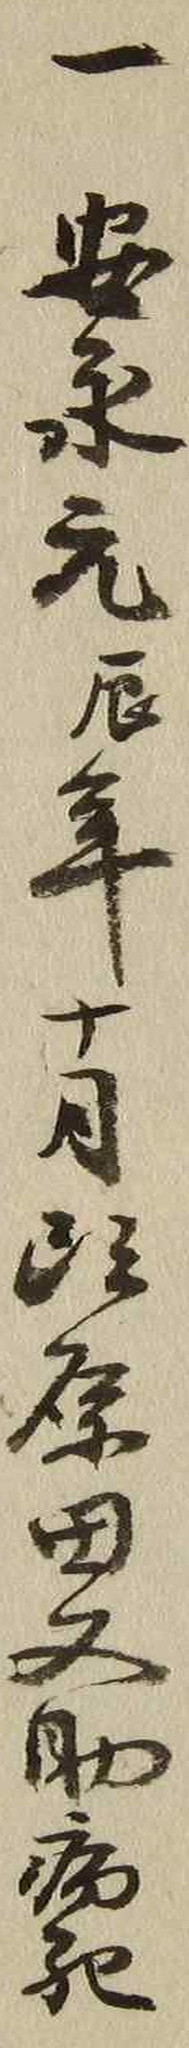一安永元辰年十月頭原田又助病死
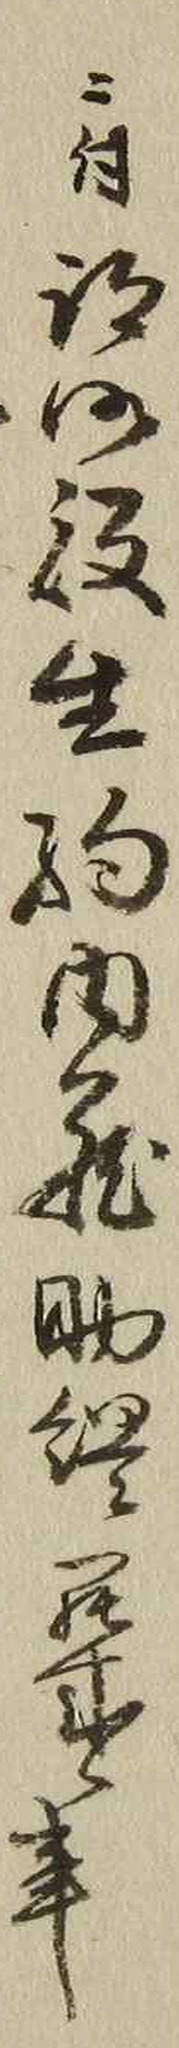ニ付跡御役生駒内蔵助組ニ罷成候事
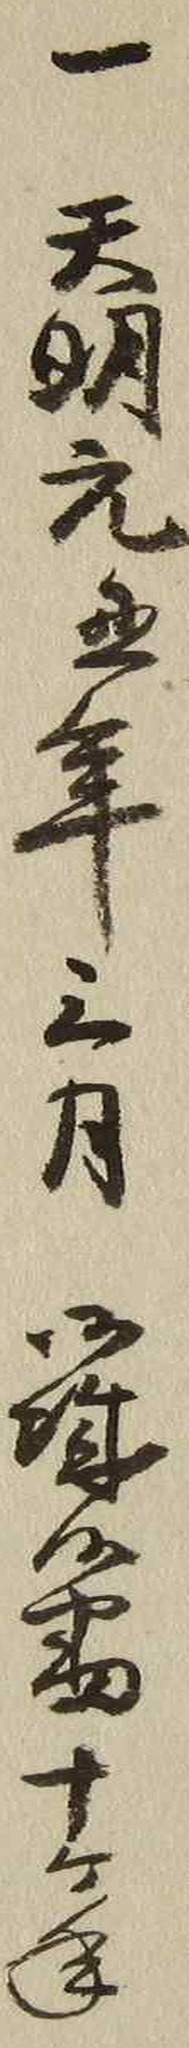一天明元丑年三月御城御番十ケ年
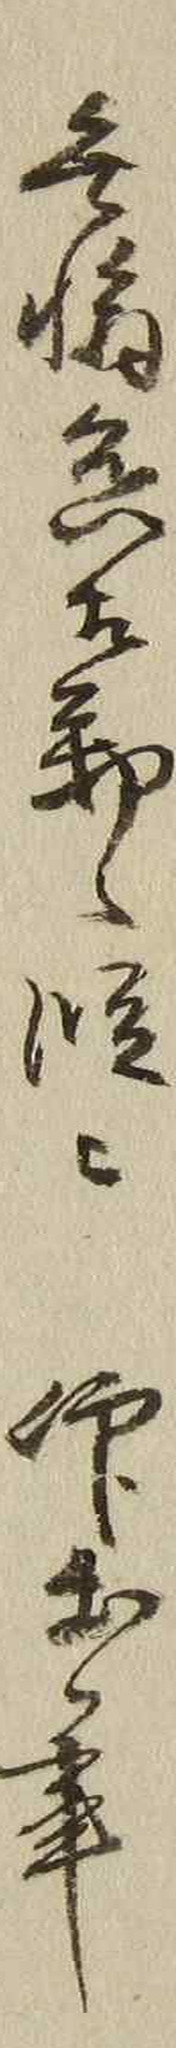無懈怠相勤候段被仰出候事
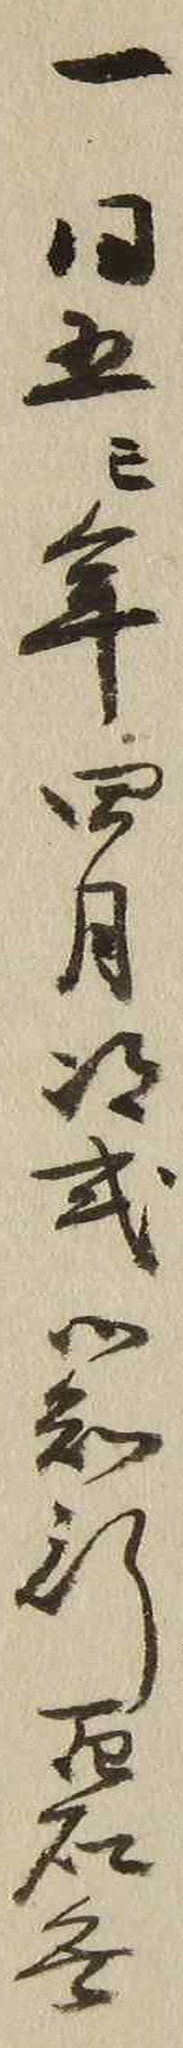一同五巳年四月跡式御知行百石無
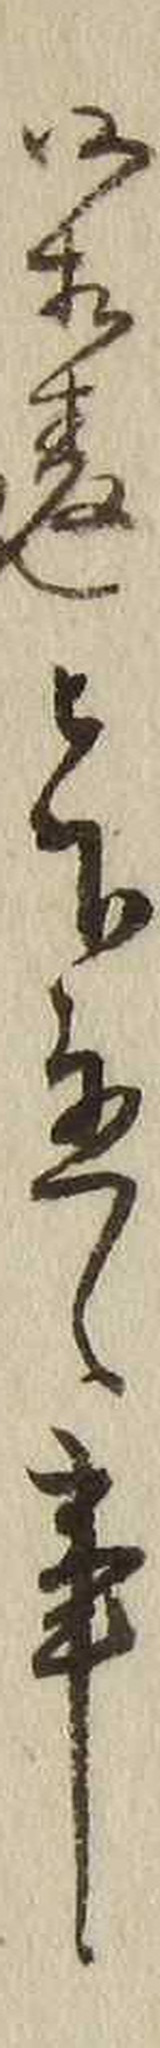御相違被下置候事
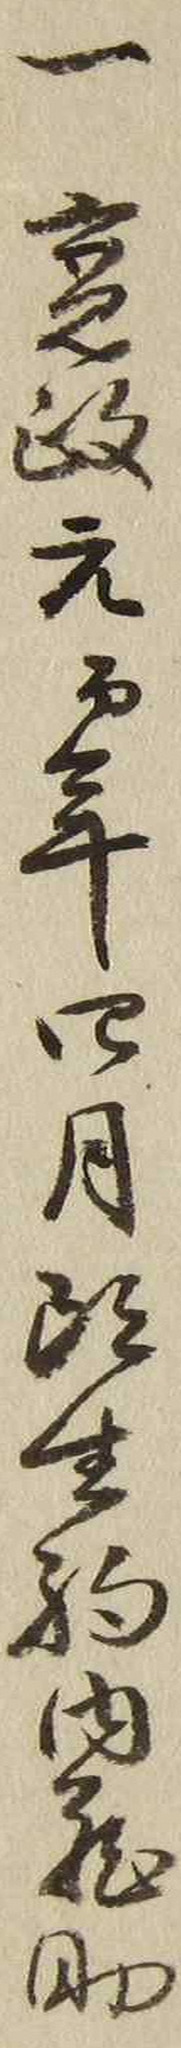一寛政元酉年四月頭生駒内蔵助
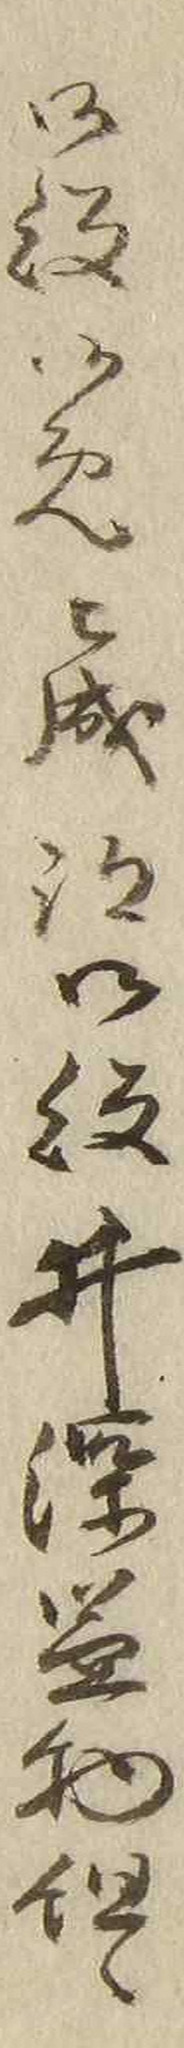御役御免被成跡御役井深監物組へ
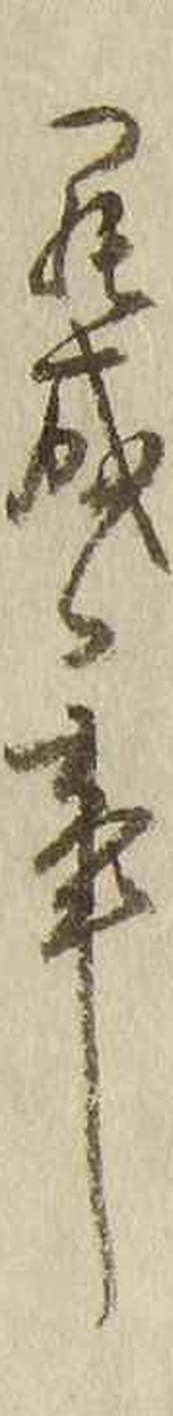罷成候事

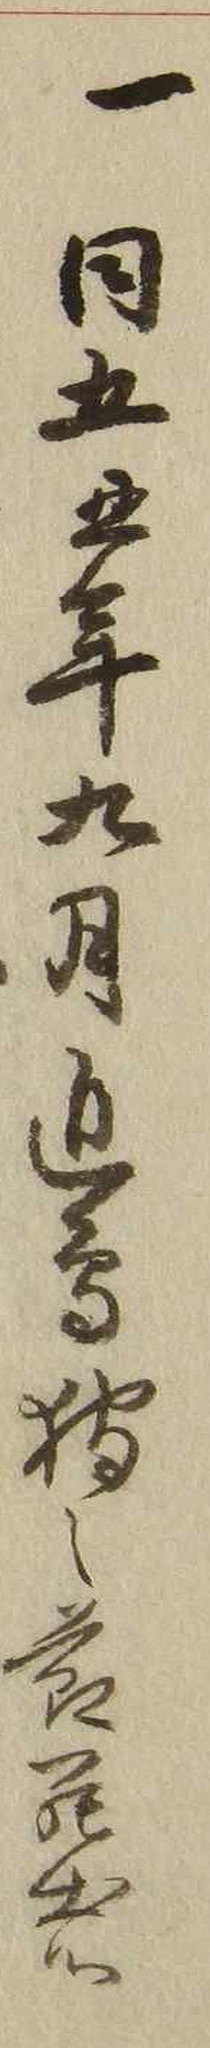一同五丑年九月追鳥狩之節罷出候
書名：諸士系譜　巻之232　け之部1
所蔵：会津若松市立会津図書館
